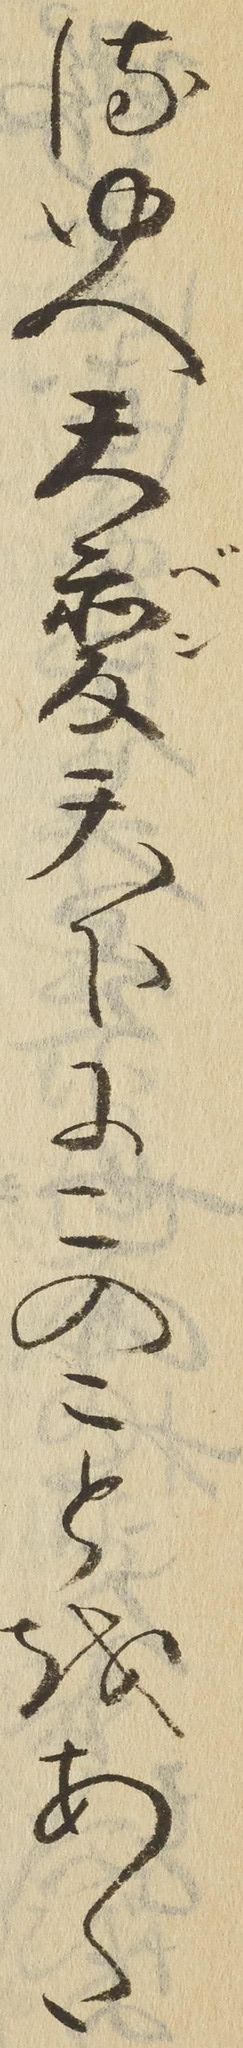なるゆへ天変天下にこのことをあた
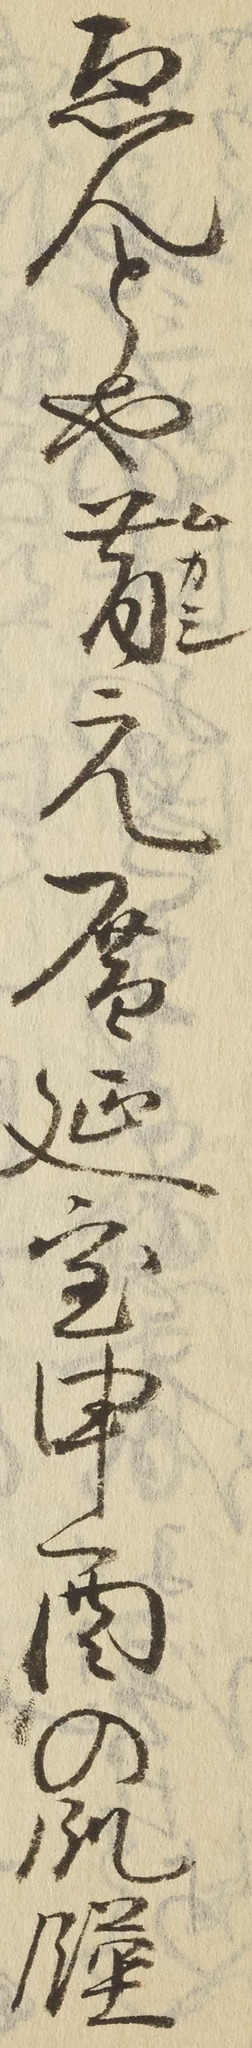ゑんとや昔元暦延宝甲酉の飢饉
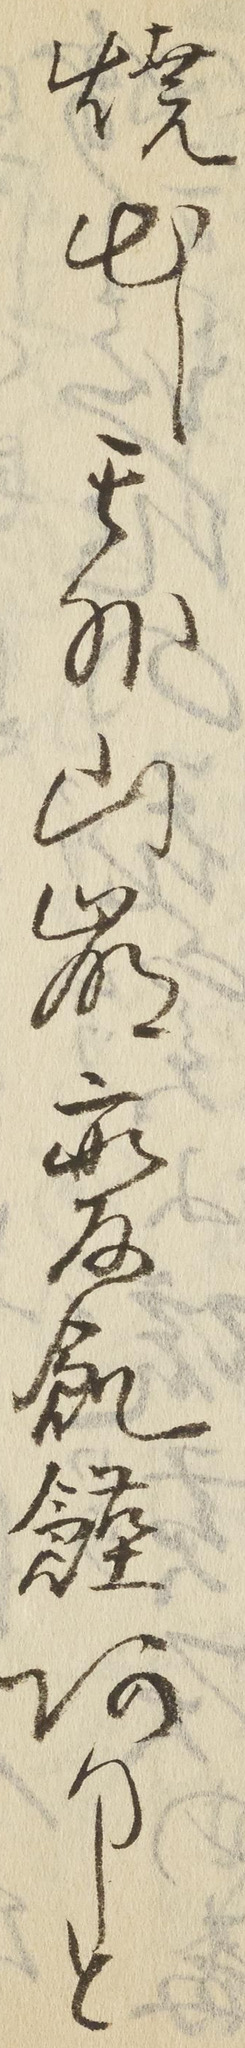焼出し其外山崩変飢饉ありしと
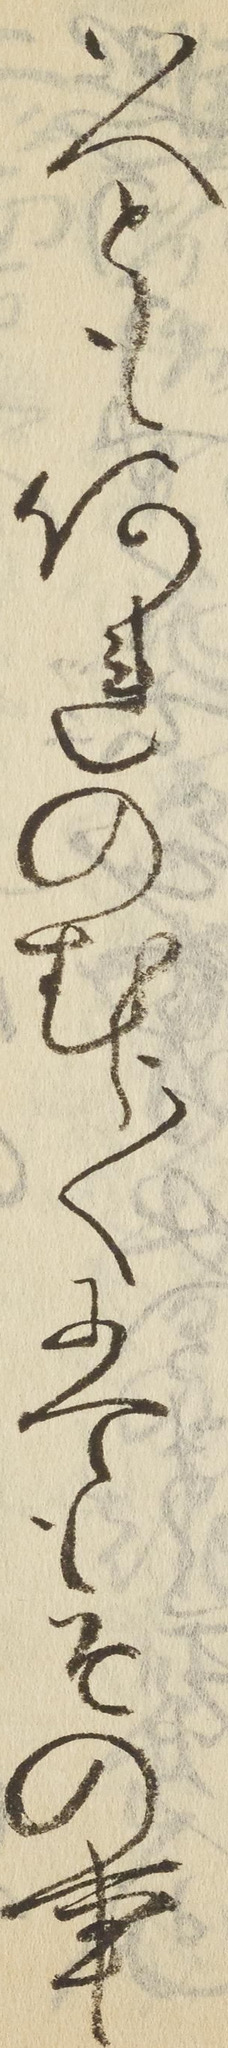いへとも何れのむら〳〵にてもその事
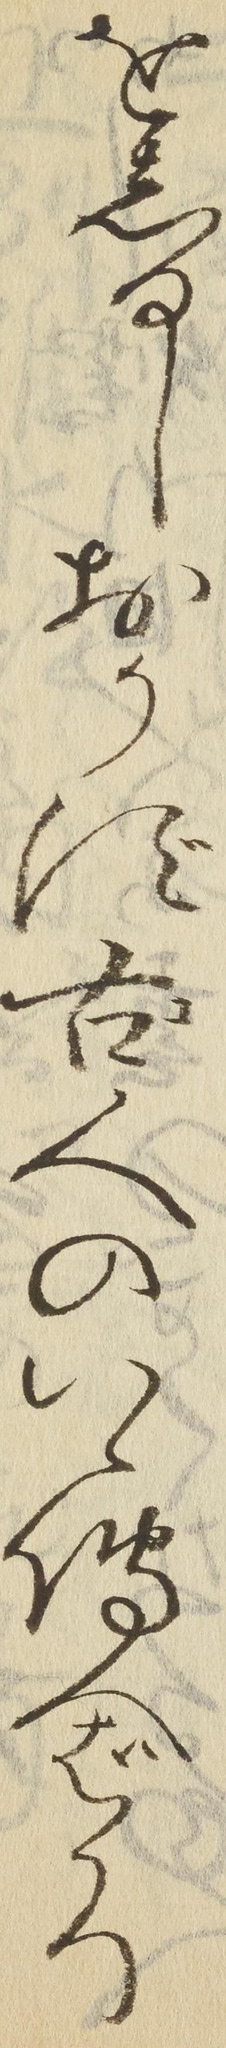しるしおかず古人のいゝ伝へばかり
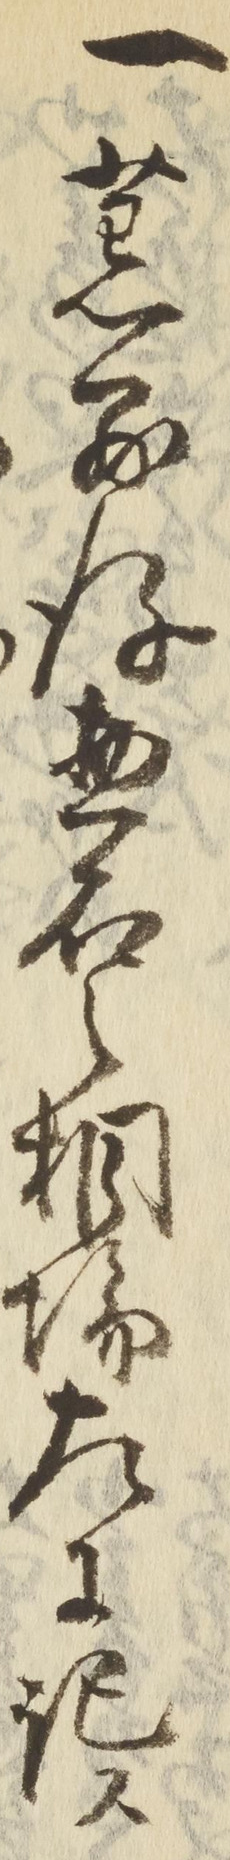一荒前後惣石之相場左に記す
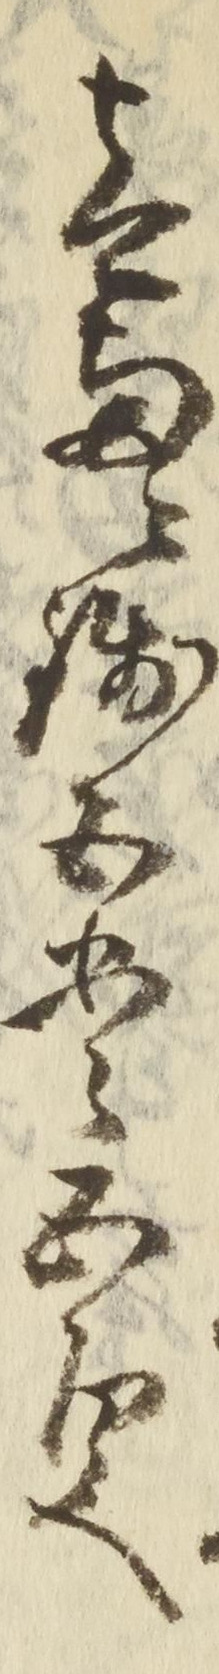壱両に銭五貫五百文
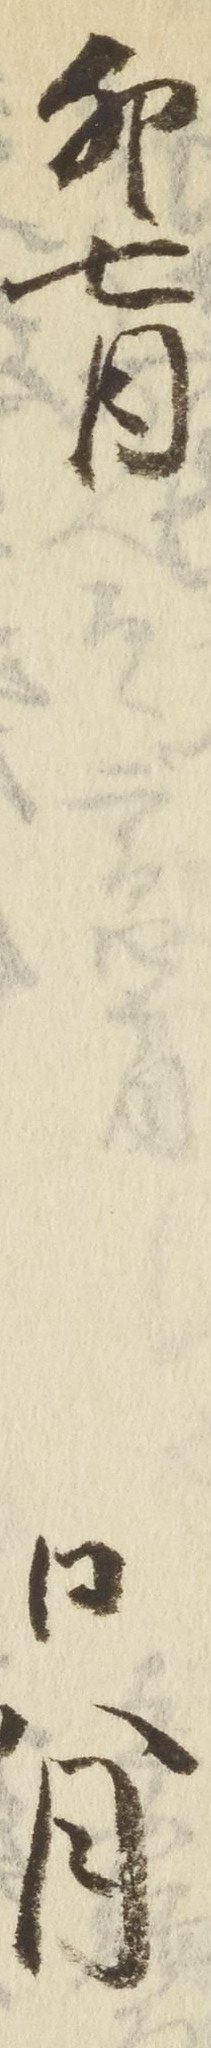卯七月同八月

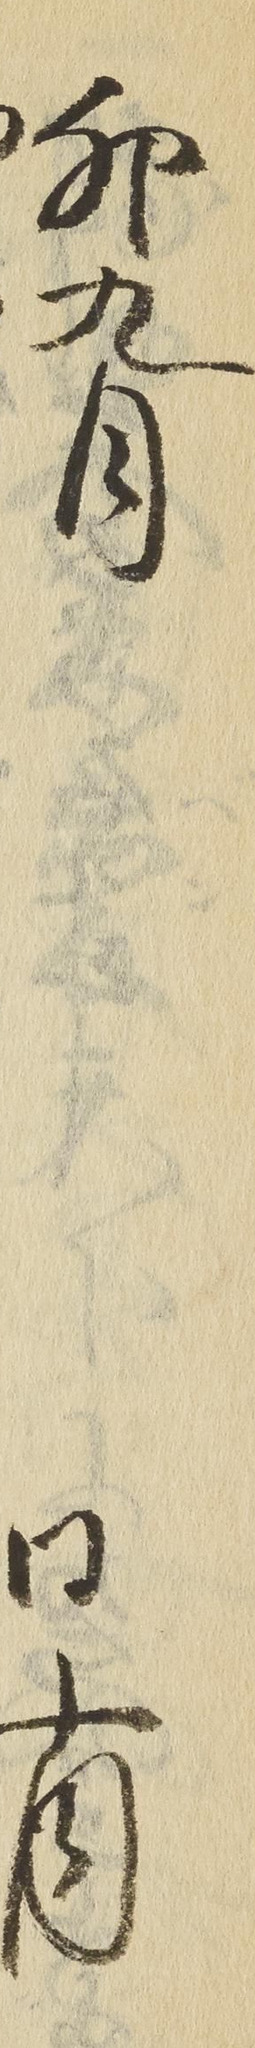卯九月同十月
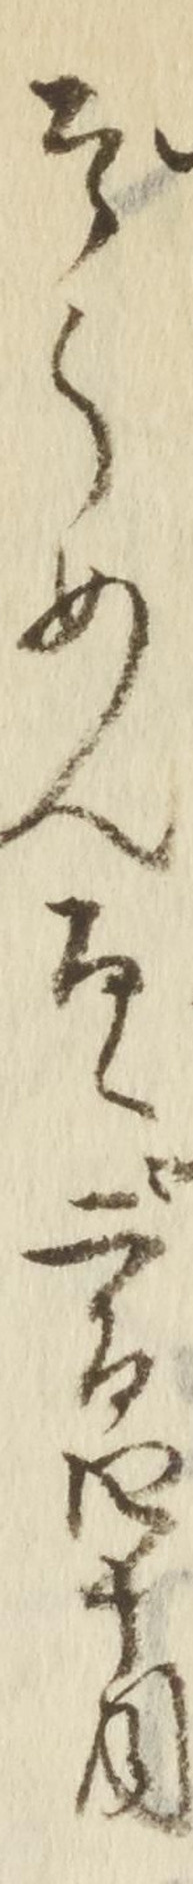そうめん百文二弐百目

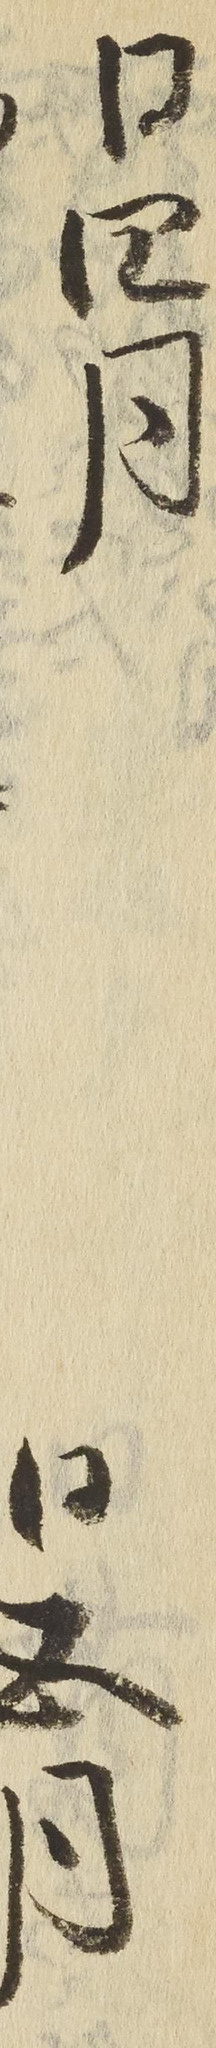同四月同五月
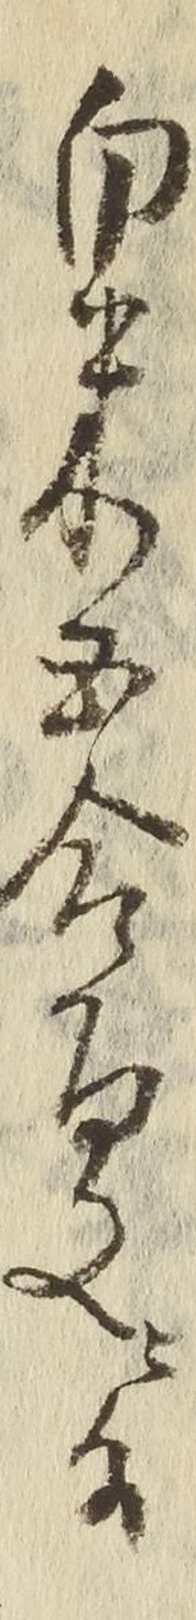白米五合百文二付
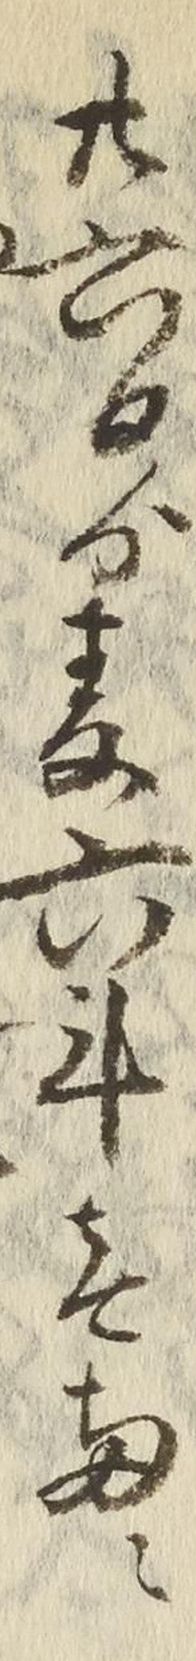廿六日ゟ麦六斗壱両二
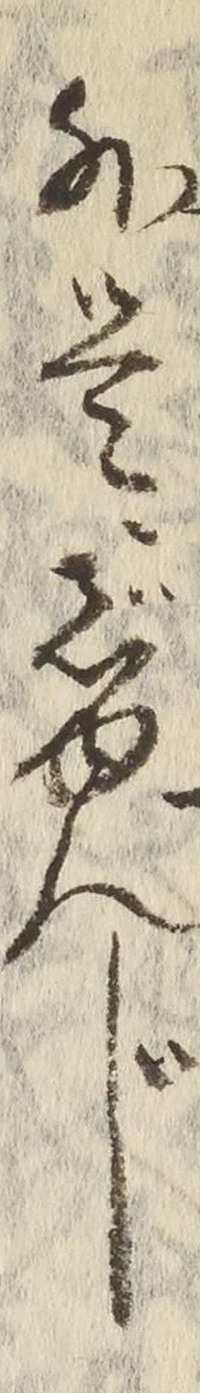外是二ぢゆんじ
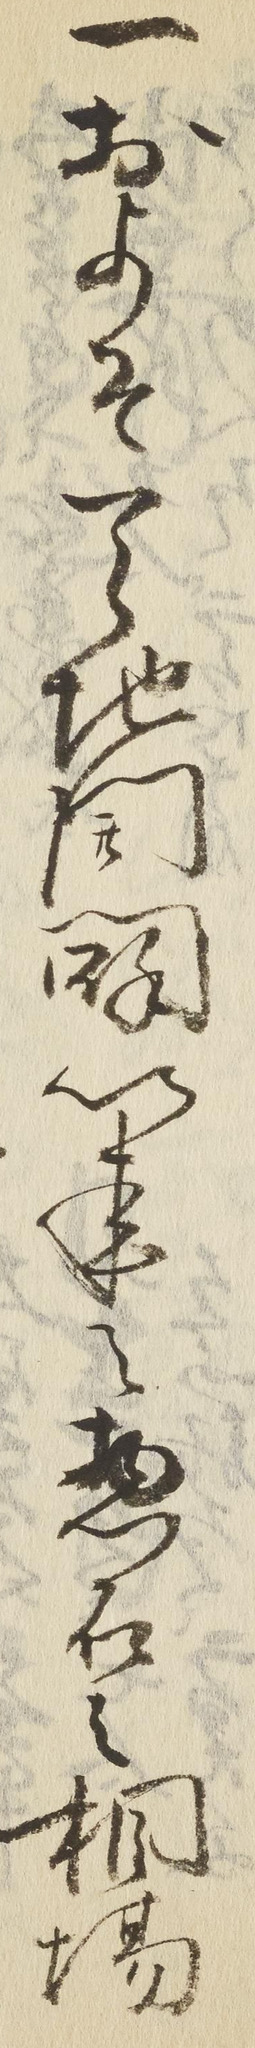一およそ天地開闢以来之惣而之相場
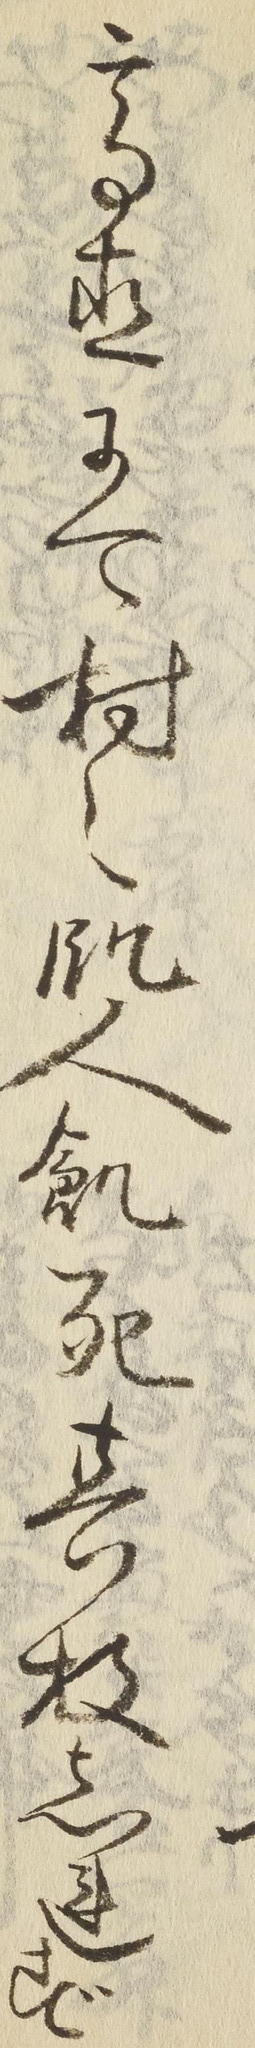高値にて村々飢人餓死其数しれず
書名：浅間大變記
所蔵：東京大学地震研究所図書室 Earthquake Research Institute Library, The University of Tokyo, JAPAN
